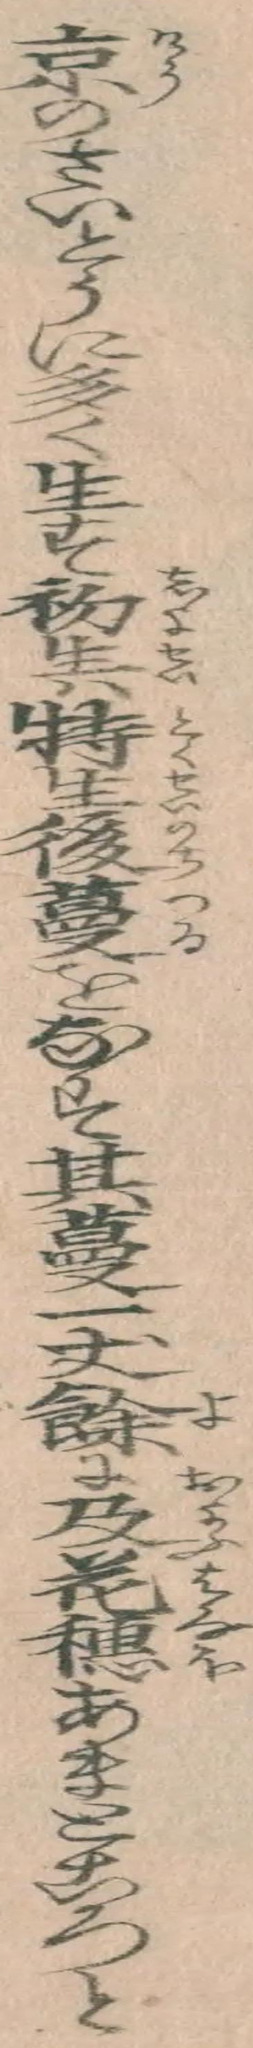京のさいとうに多く生す初生は特生後蔓をなす其蔓一丈余に及花穂あまところと
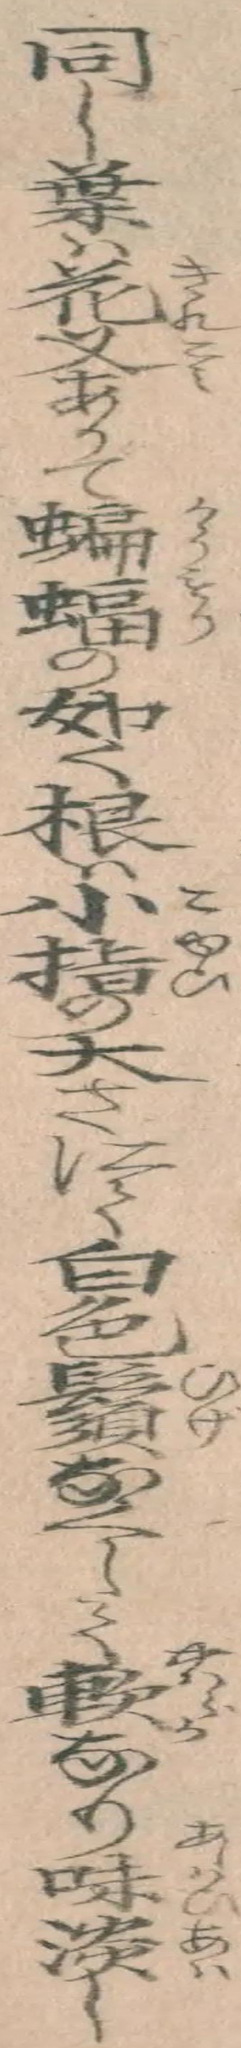同し葉は花叉ありて蝙蝠の如く根は小指の大さにて白色鬚なくして軟なり味淡し
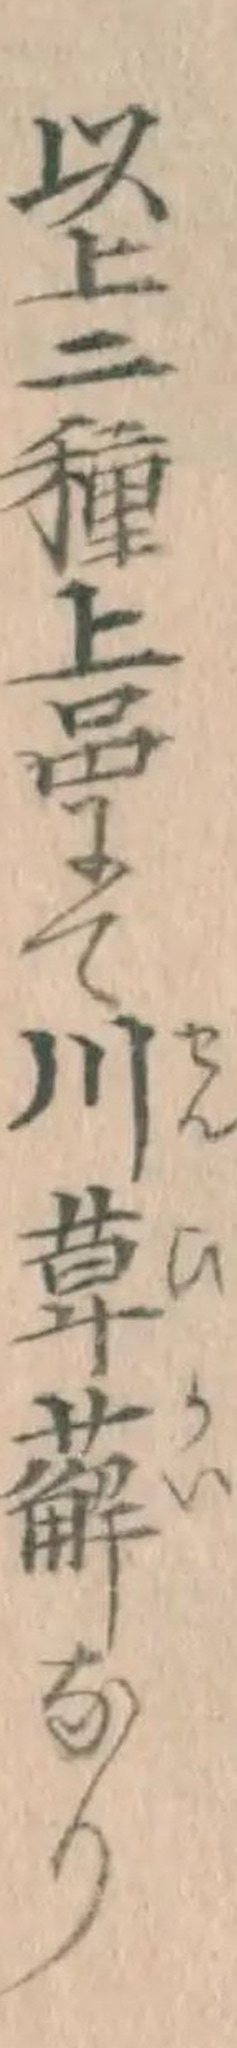以上二種上品にて川萆薢なり

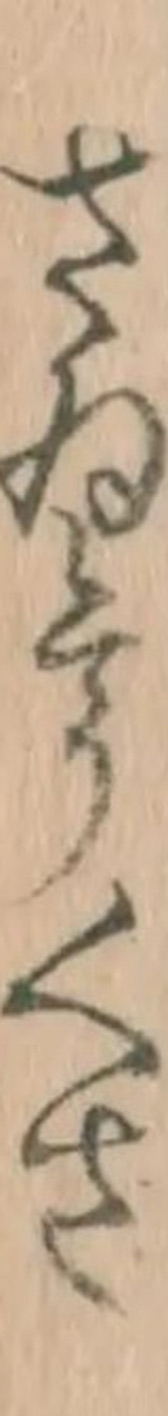さゐとうくさ

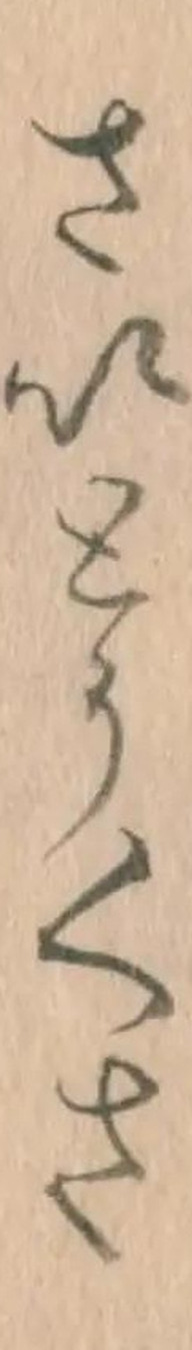さいとうくさ

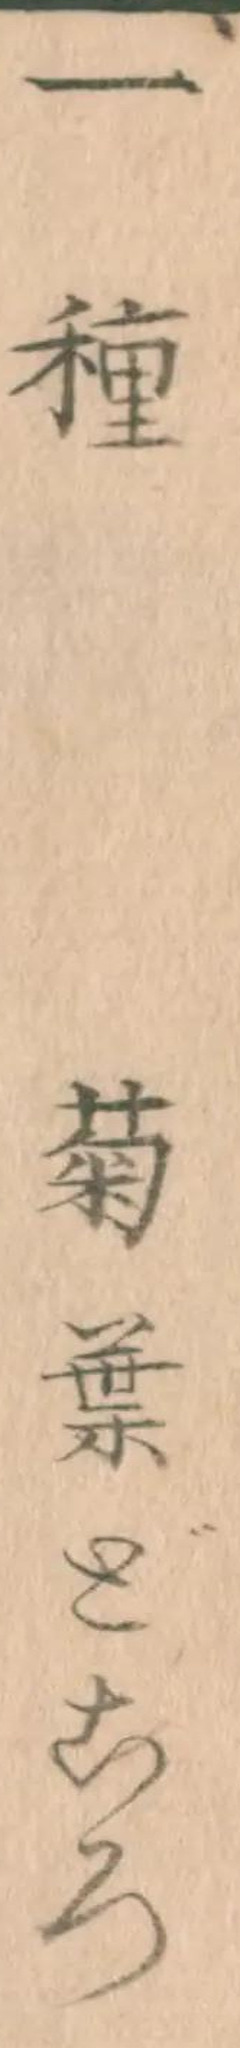一種菊葉ところ
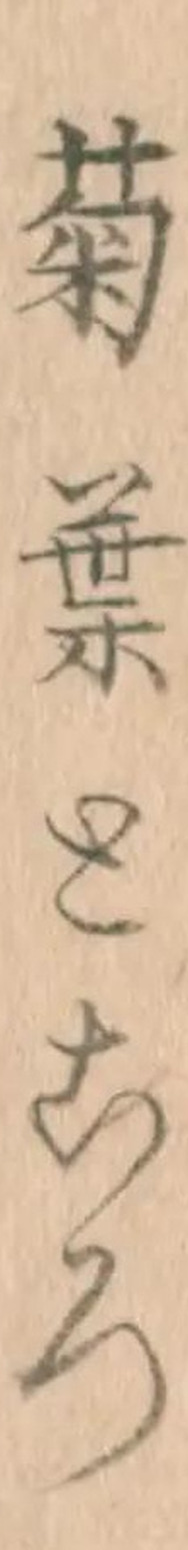菊葉ところ
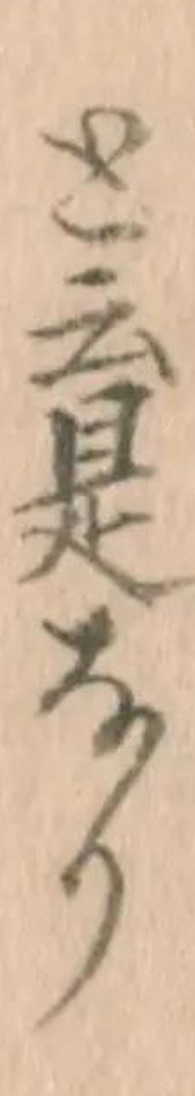と云是なり
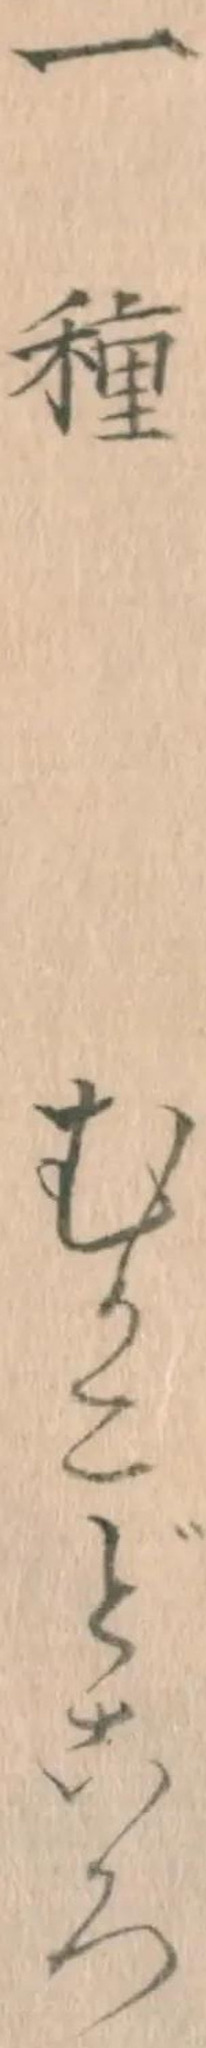一種むかこどころ
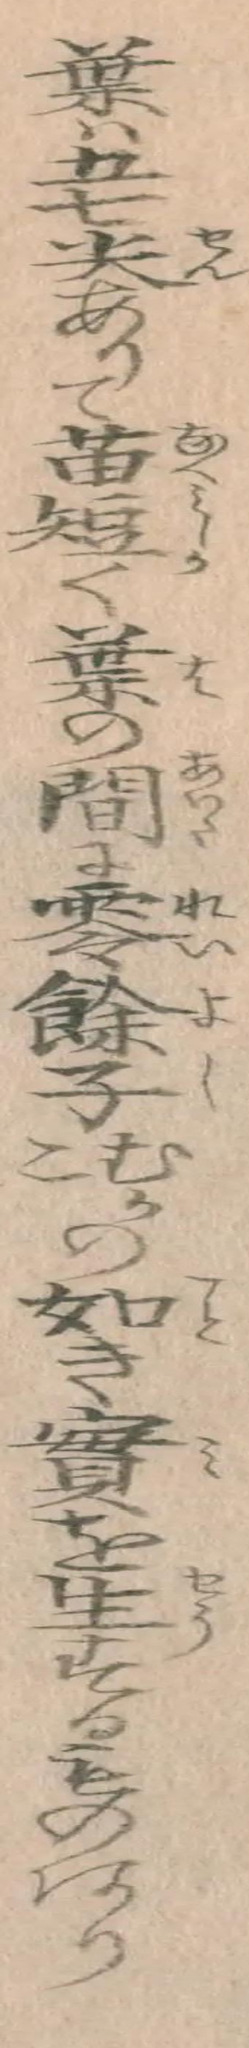葉は五七尖ありて苗短く葉の間に零余子むかこの如き実を生するものあり
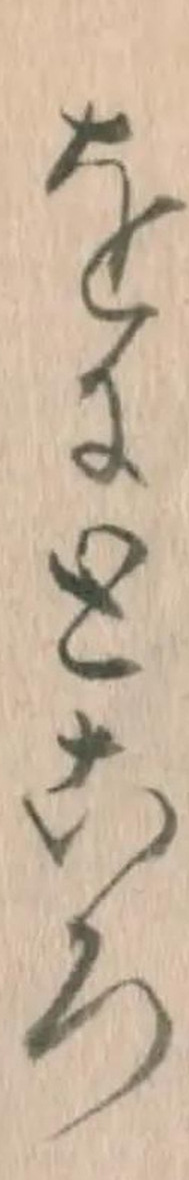菊葉ところ
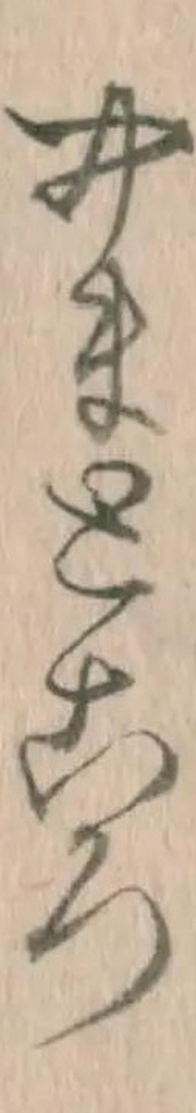菊葉ところ
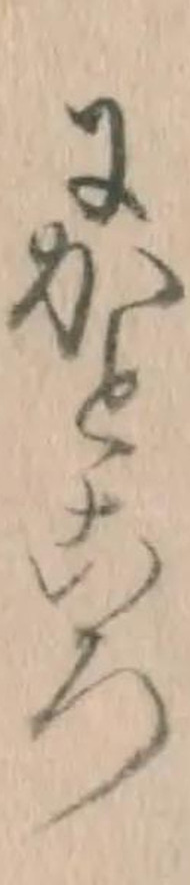菊葉ところ
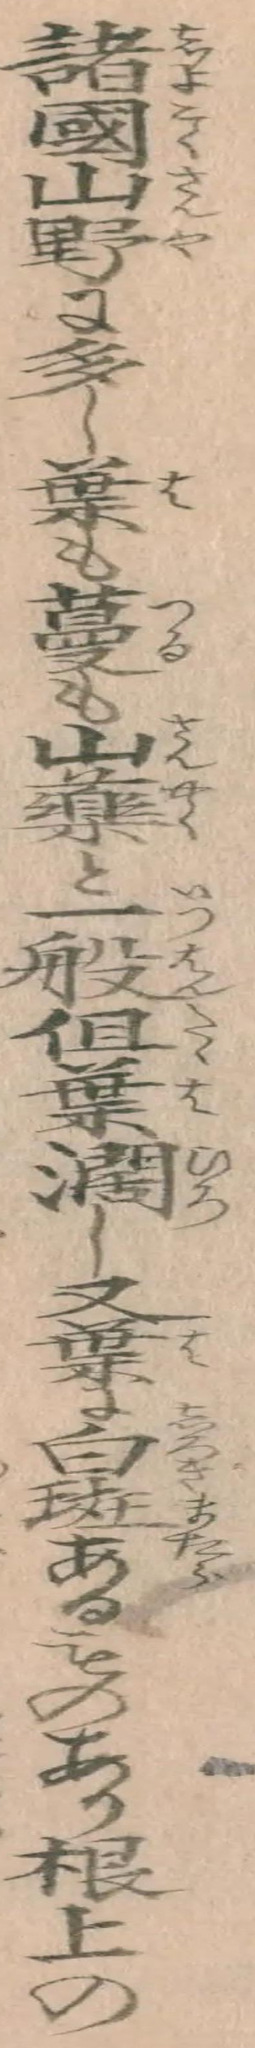諸国山野に多し葉も蔓も山薬と一般但葉闊し又葉に白斑あるものあり根上の
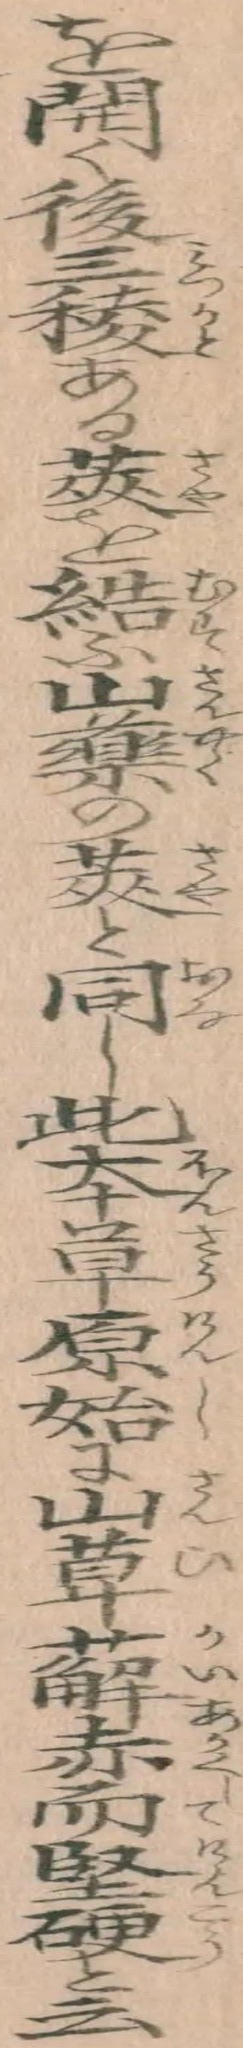を開く後三稜ある莢を結ふ山薬の莢と同し此本草原始に山萆薢赤而堅硬と云
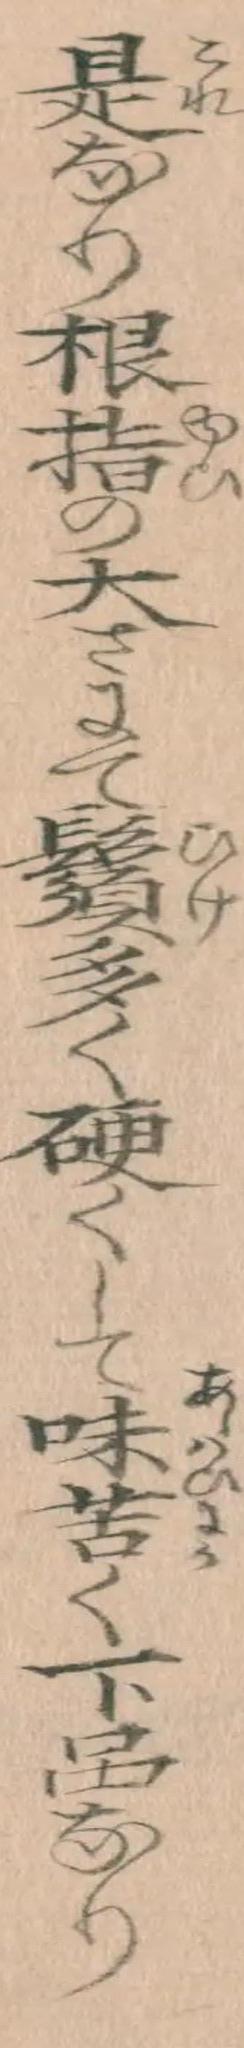是なり根指の大さにて鬚多く硬くして味苦く下品なり
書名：本草図譜. 巻28-30
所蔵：国立国会図書館 National Diet Library, JAPAN
